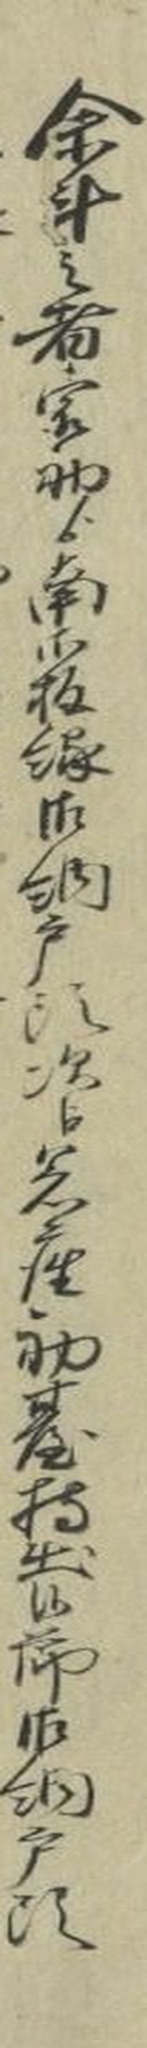一余計之者最初ゟ南御板縁御納戸頭次え着座初台持出候節御納戸頭
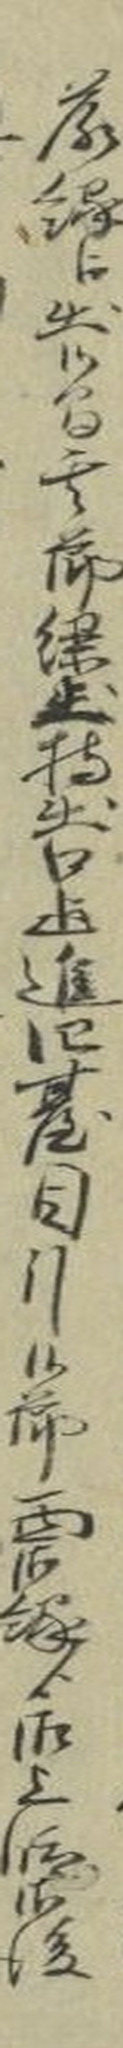落縁え出候間其節繰出持出口迄進四台目引候節西御縁ゟ御上段御後
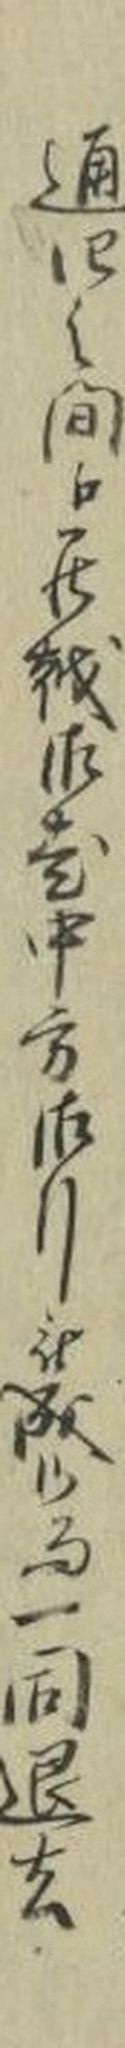通四之間え罷越御老中方御引被成候て一同退出
